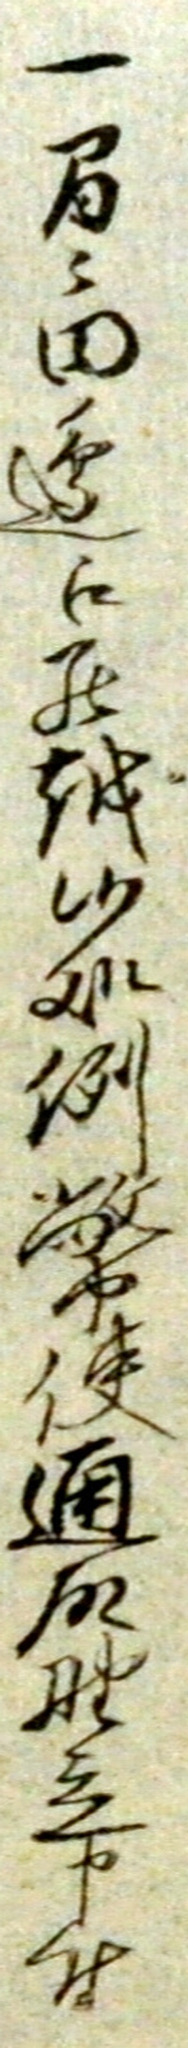一間ニ田邉江罷越候処例幣使通故野立申付
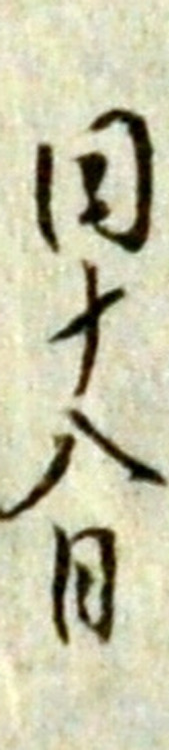同十八日
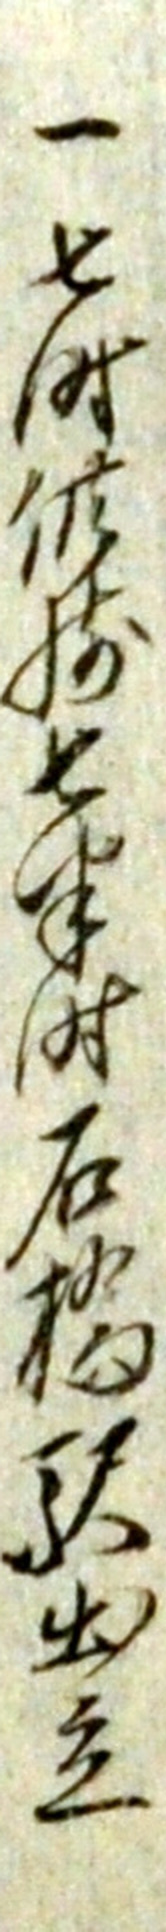一七時供揃七半時石動駅出立
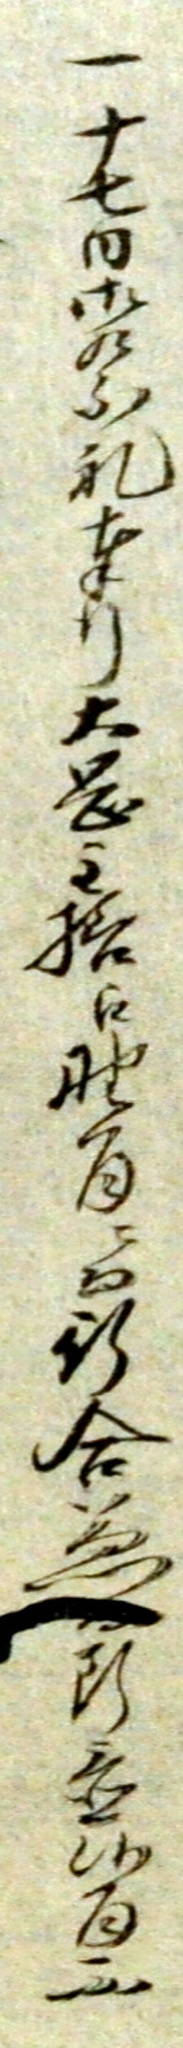一十七日御祭礼奉行大岡主膳江野間ニ而行合兼而断置候間不
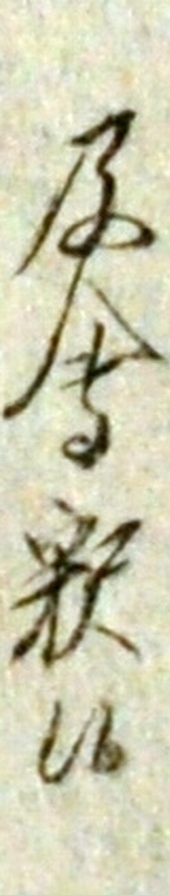及会釈候
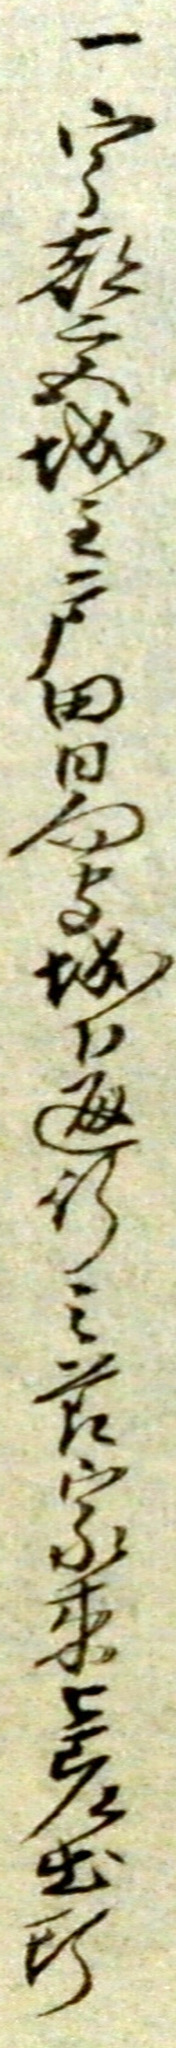一宇都宮城主戸田日向守城下通行之節家来差出断
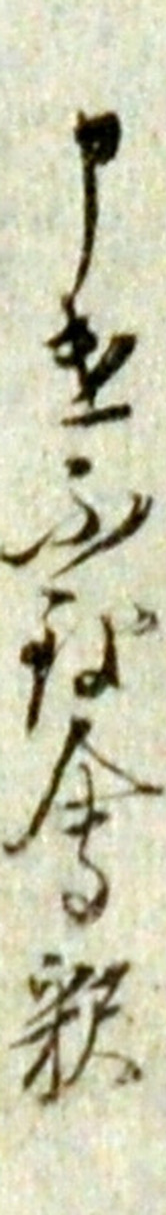申遣不致会釈
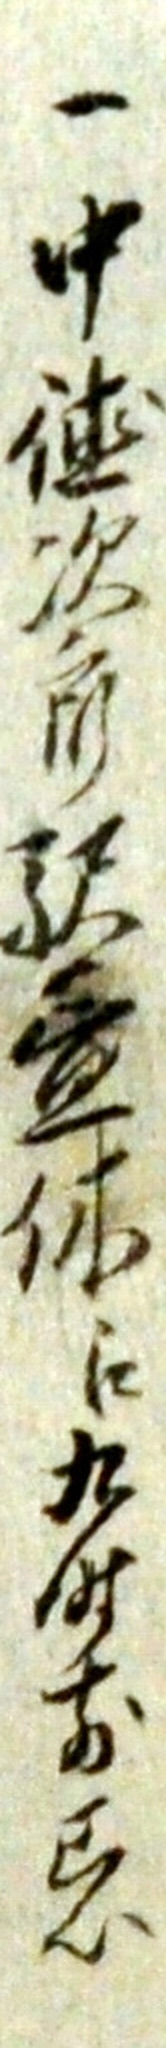一中徳次衆駅昼休江九時前着

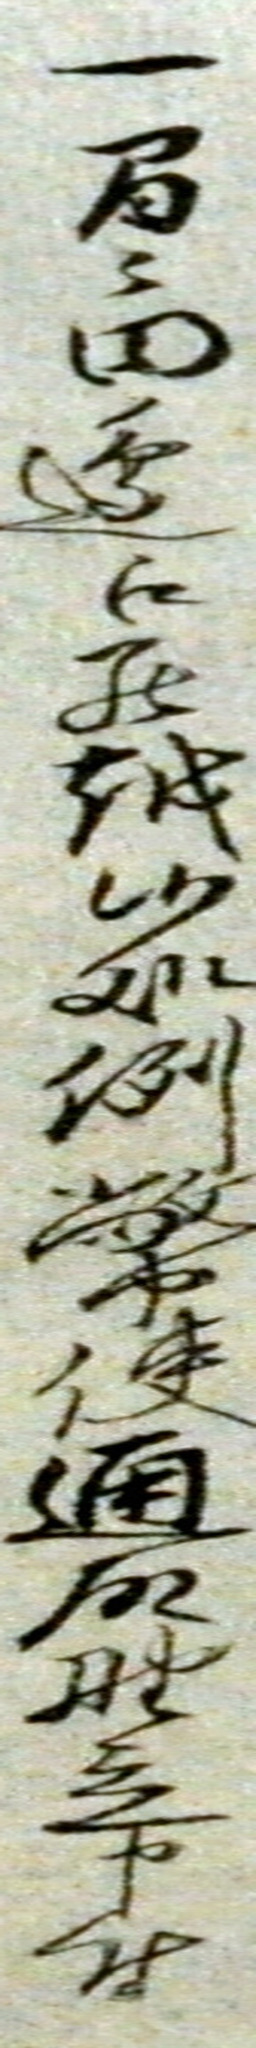一間二田邉江罷越候処例幣使通故野立申付
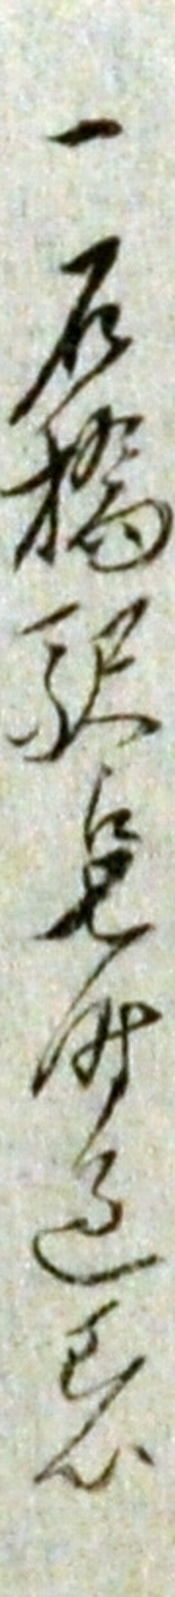一石動駅江七時過着
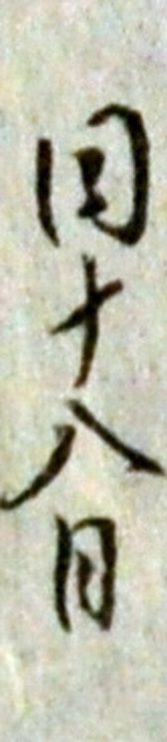同十八日
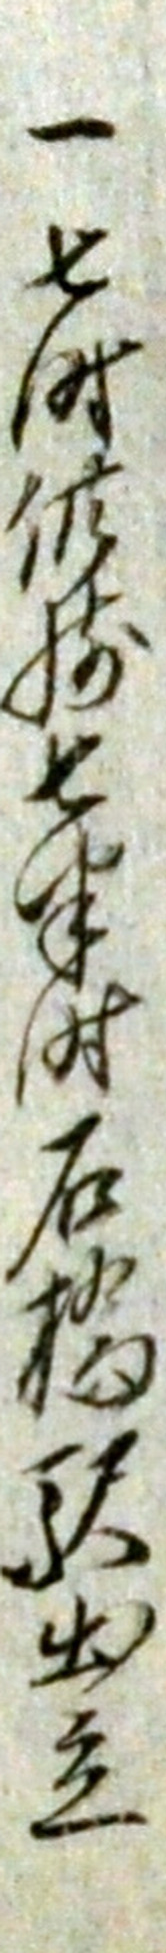一七時供揃七半時石動駅出立
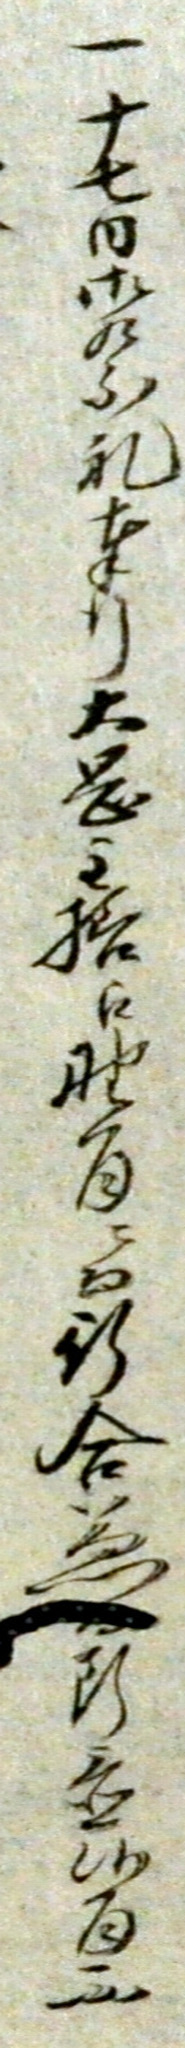一十七日御祭礼奉行大岡主膳江野間ニ而行合兼而断置候間不
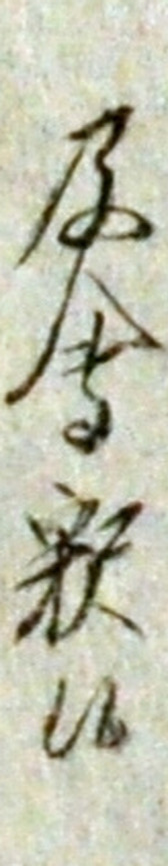及会釈候
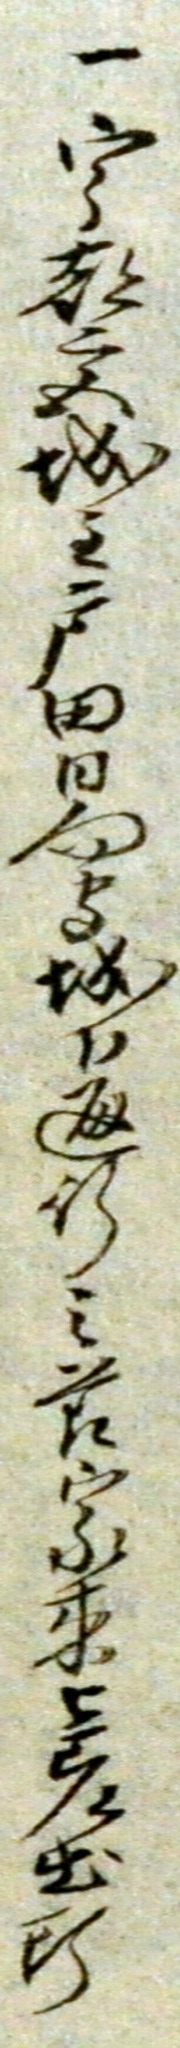一宇都宮城主戸田日向守城下通行之節家来差出断
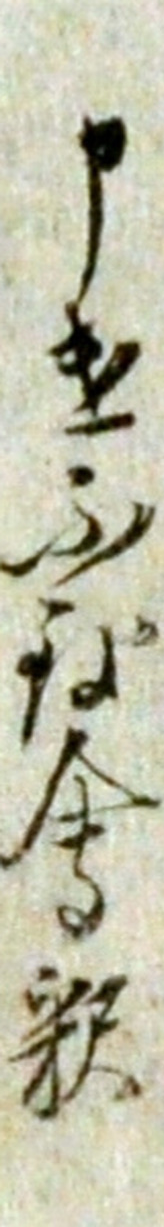申遣不致会釈
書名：日光御名代相勤候節ノ留
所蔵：伊那市立高遠町図書館・合同会社AMANE
